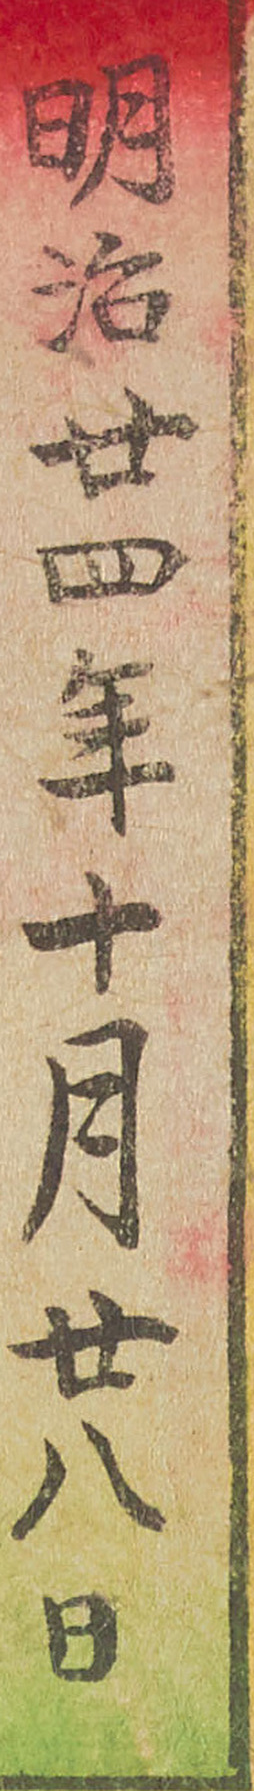明治廿四年十月廿八日
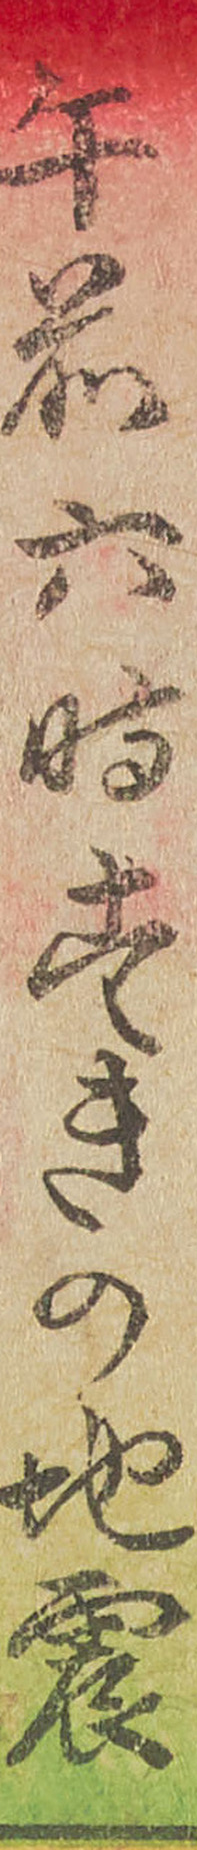午前六時すきの地震
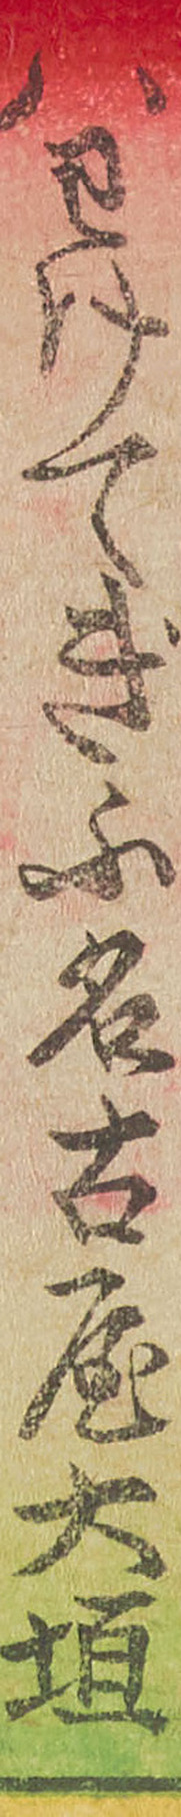はわけてぎふ名古屋大垣
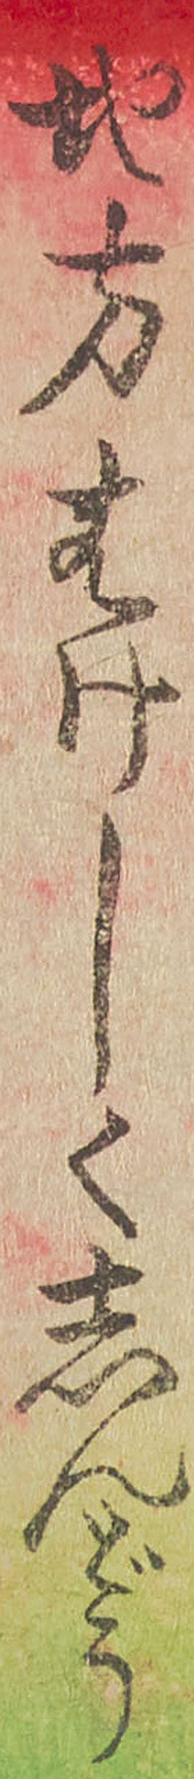地方はけしくしんどう
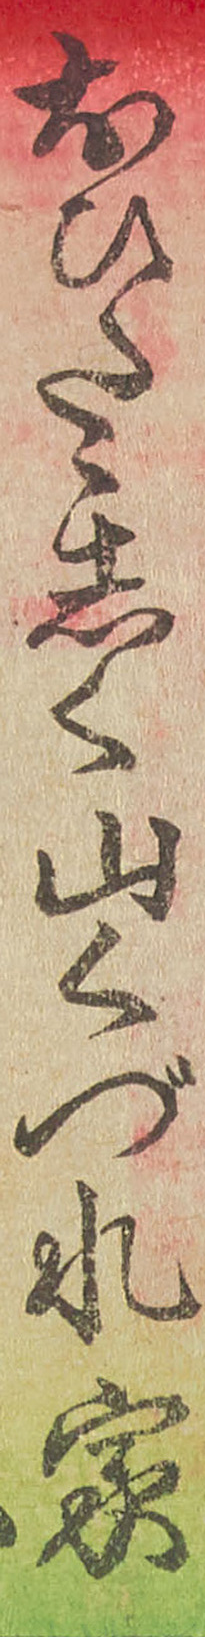おひたゝしく山くづれ家
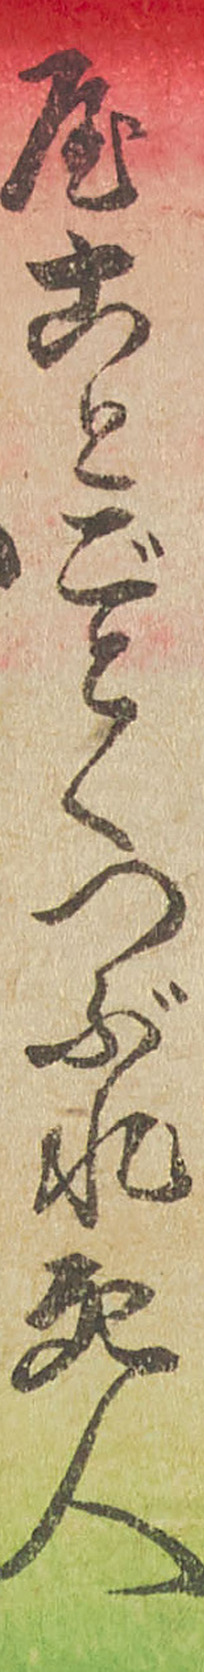屋ことごとくつぶれ死人
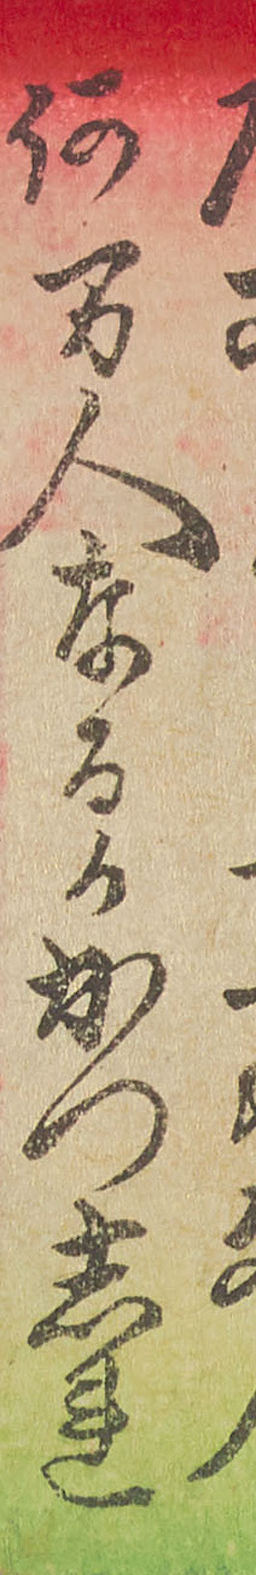何万人なるかかつしれ
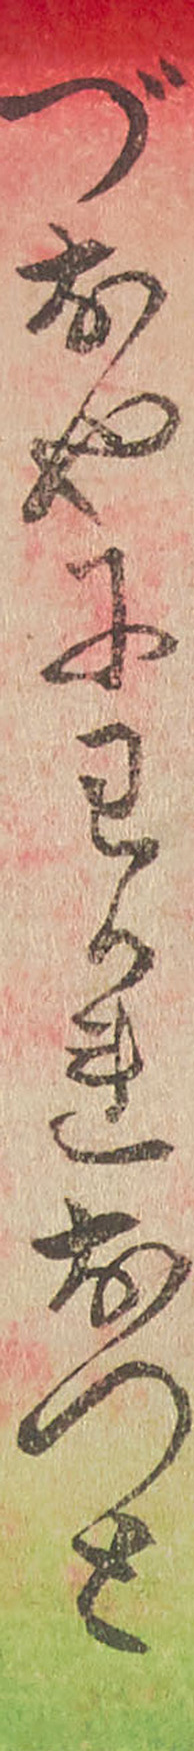づおやにわかれおつと
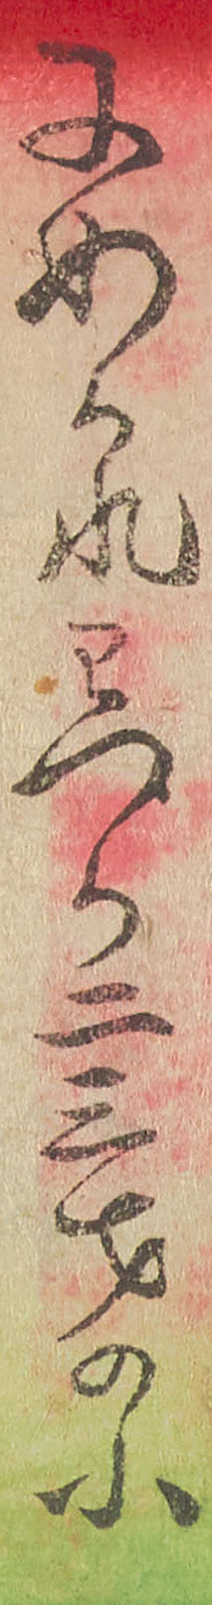にわかれわつか二三才の小
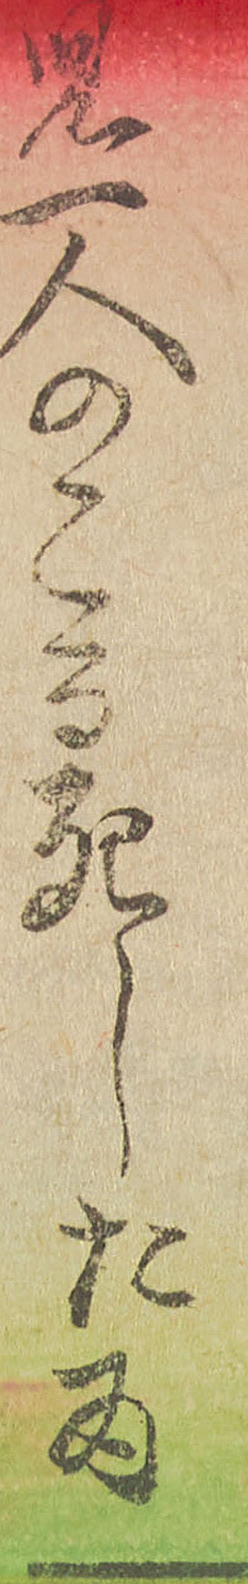児一人のこる死したる
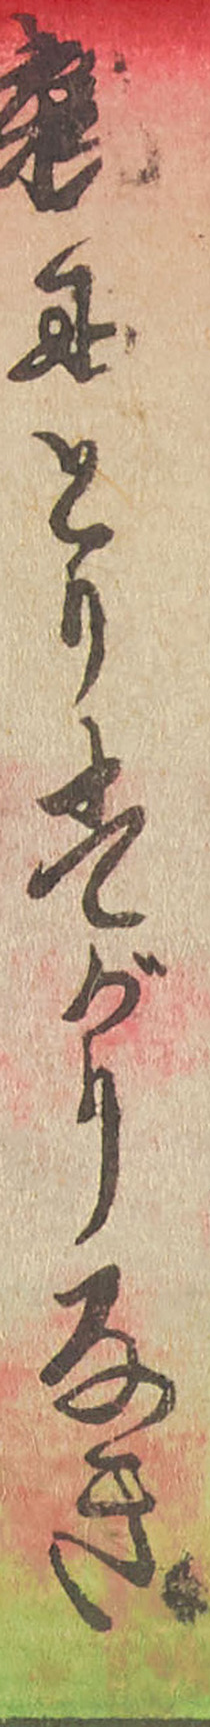骸？にとりすがりなき
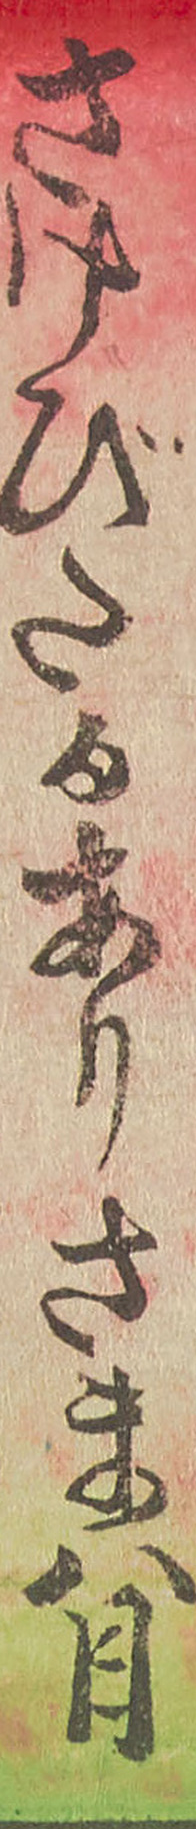さけびたるありさまは目
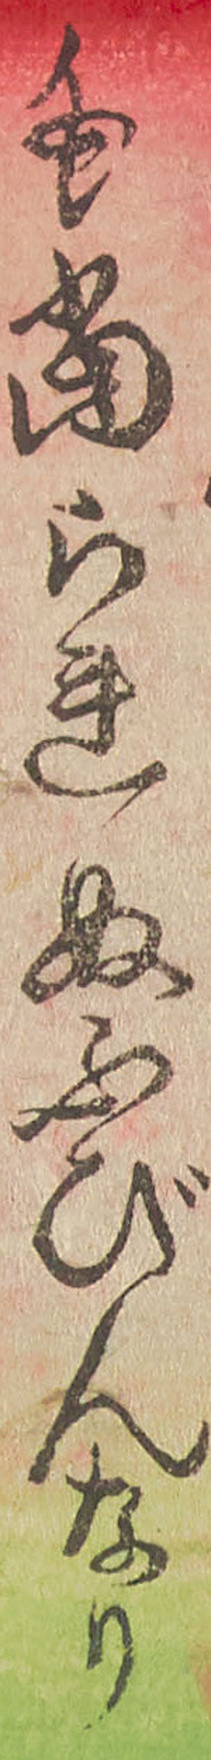も当られぬふびんなり
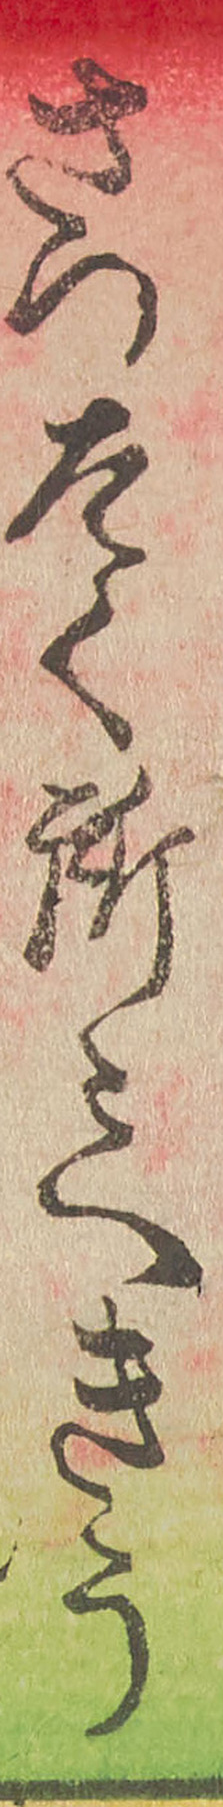さつそく所々へきう
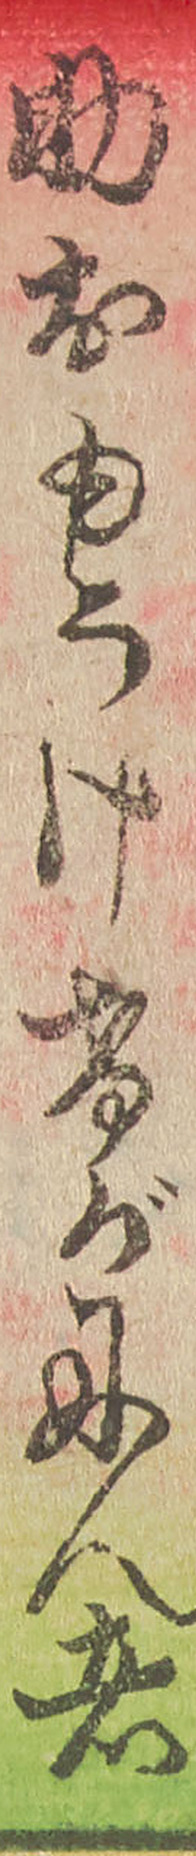助おもうけけがにんは
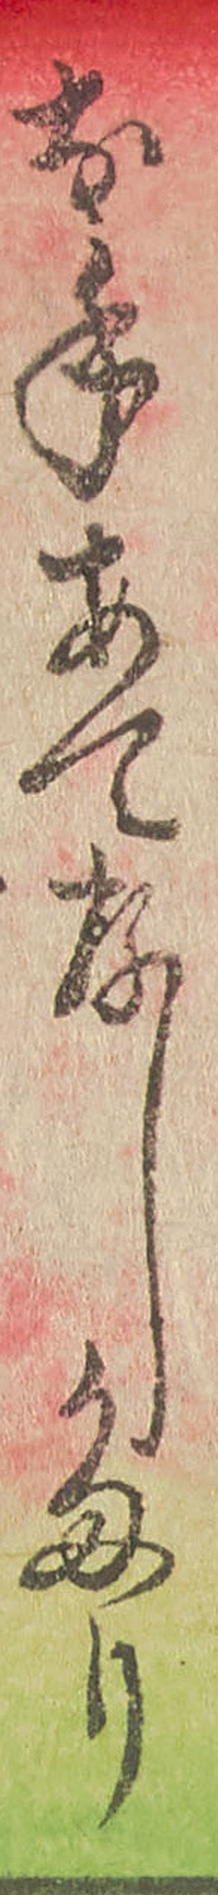お手あてなしたり
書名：明治廿四年十月廿八日大地震後図
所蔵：東京大学総合図書館 General Library in the University of Tokyo, JAPAN
